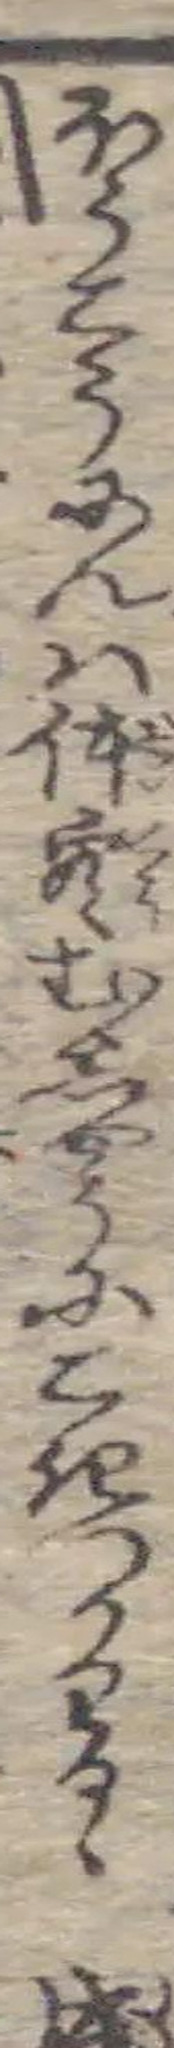ほうこうにんは体空むしやうにこきつかわるゝ成実宗
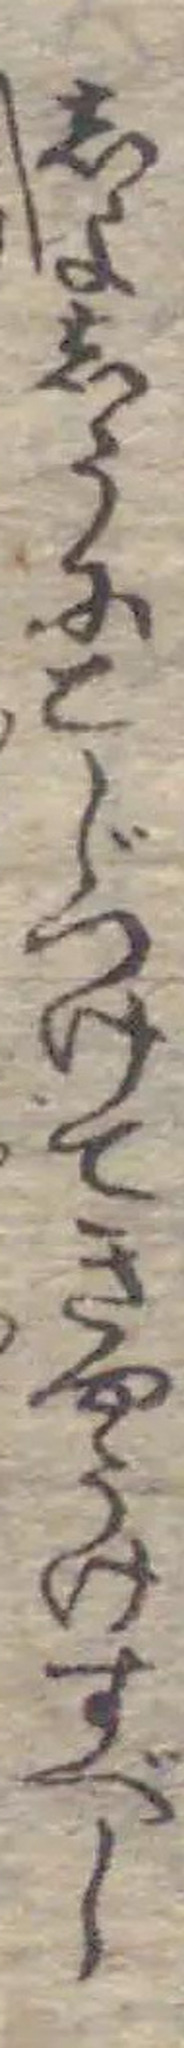しよほうにこじつけてきやうけすべし
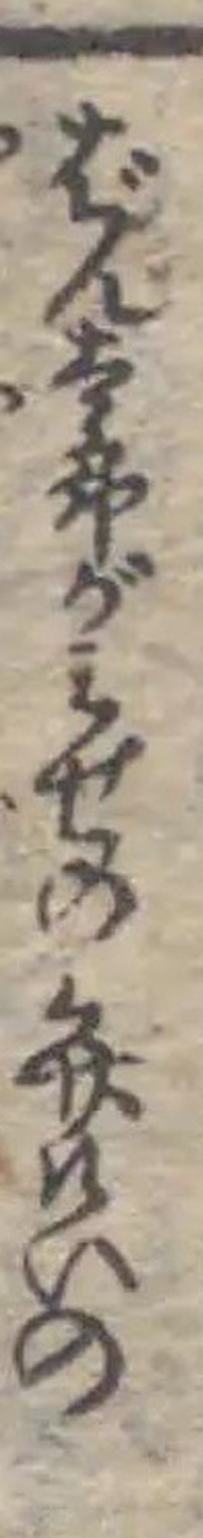ばん太郎がみせの弁けいの
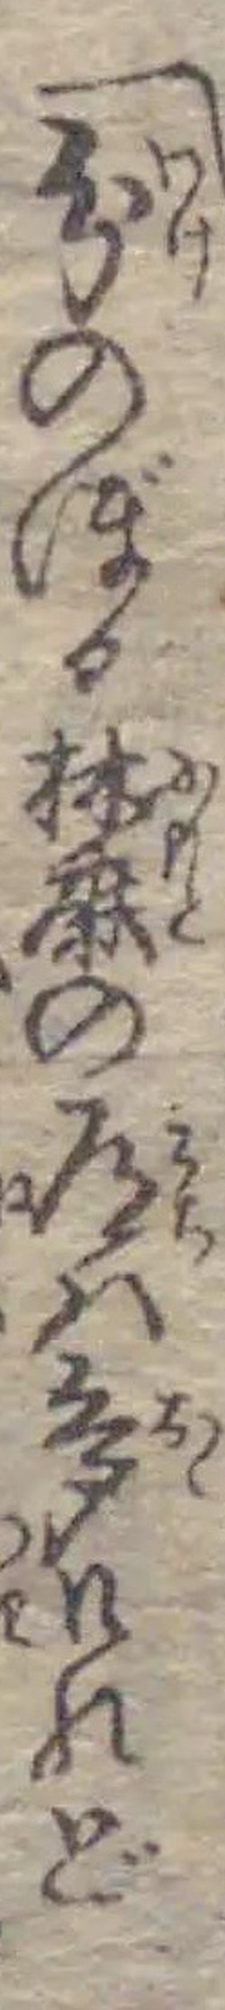〽分のぼる麓の道は多けれど
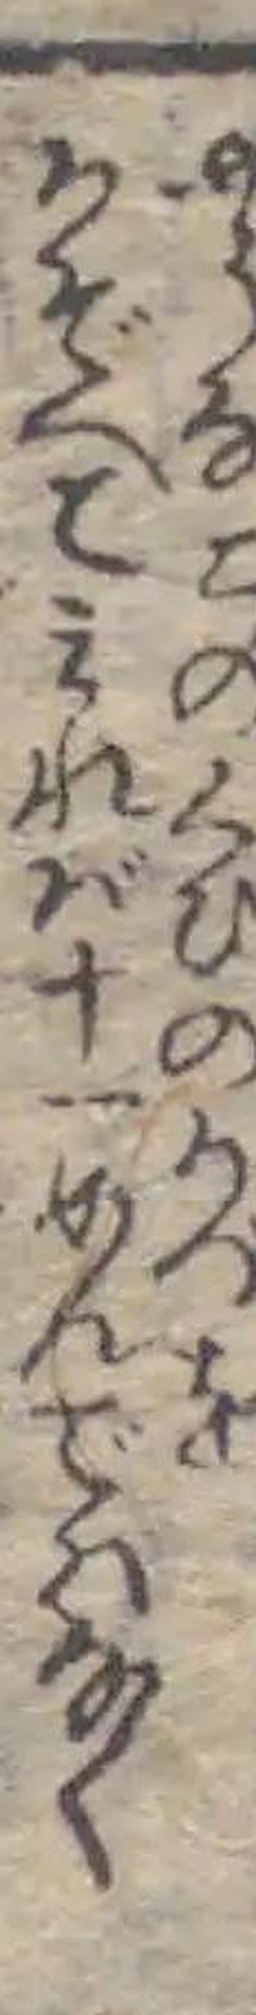かぞへてみれば十一めんではなく
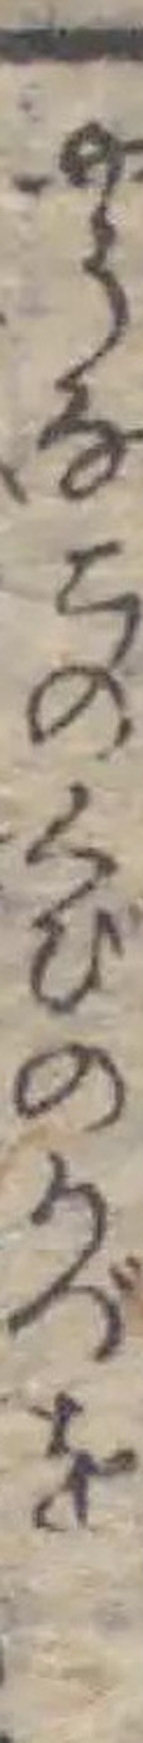やうなこのくびのかづを
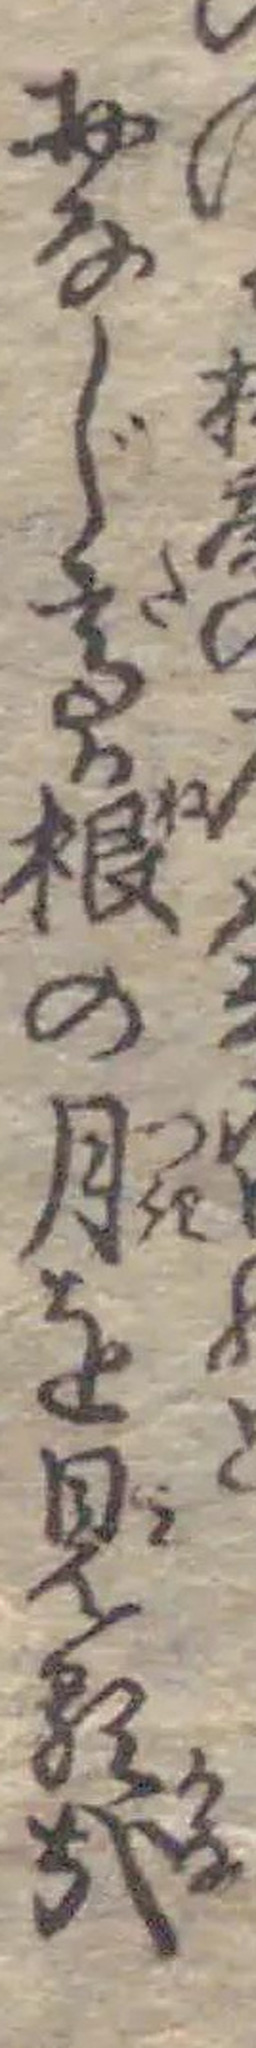おなじ高か根の月を見る哉
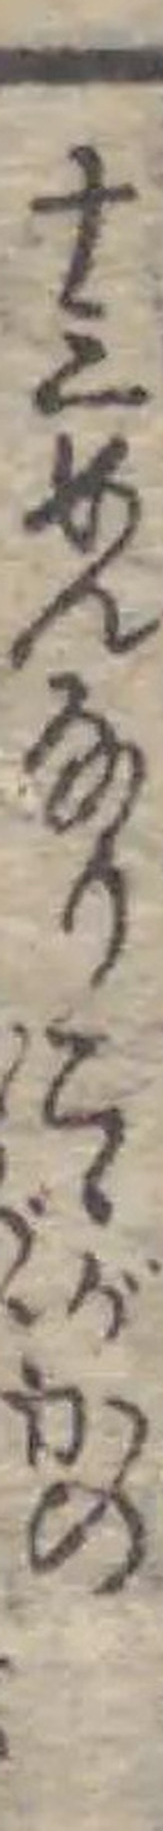十三めんなりこゝがかの
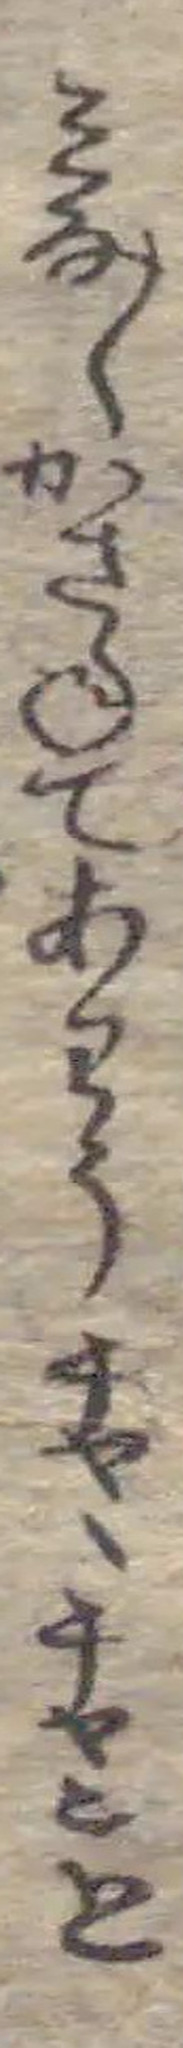みな〳〵かさねてあわうチャヽチャンと
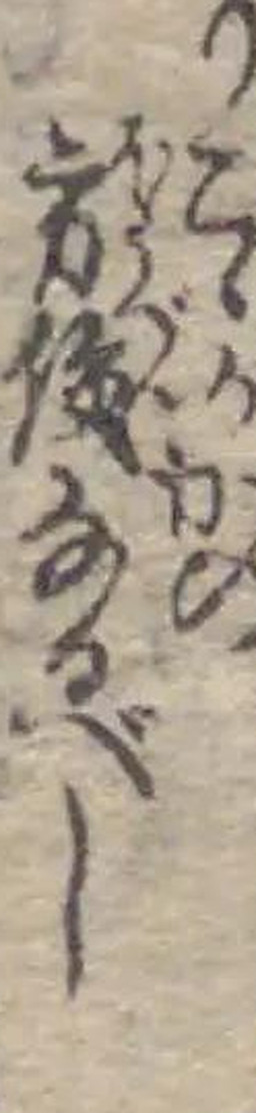方便なるべし
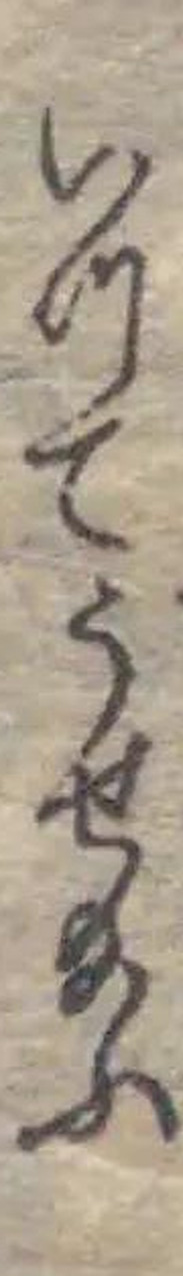いつてうせ給ふ
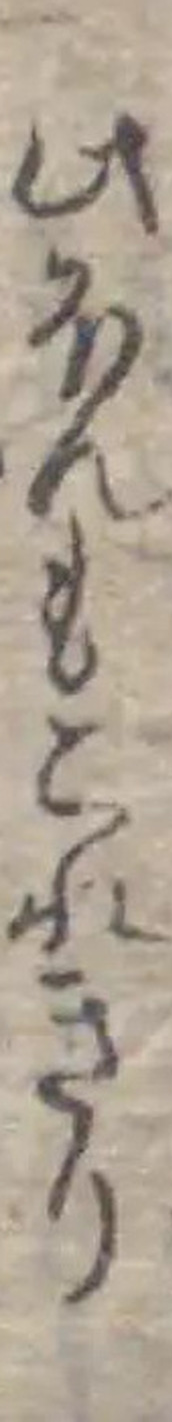此ほんもこれきり
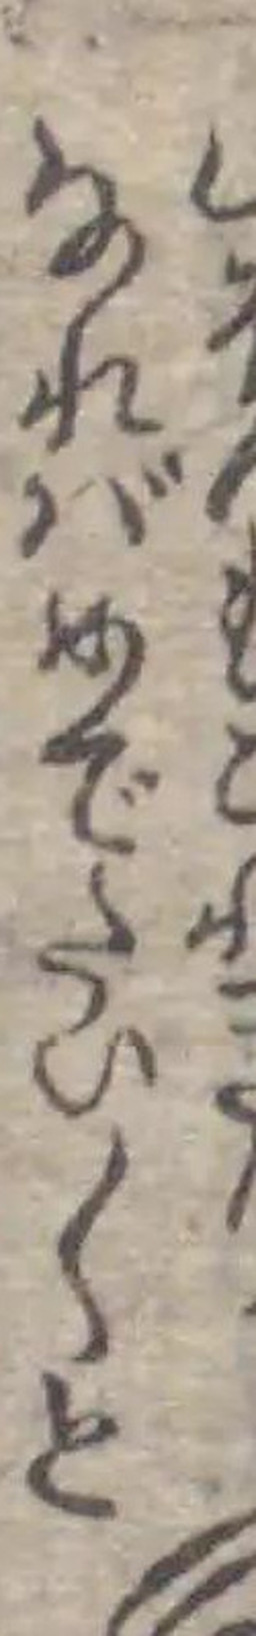なればめだたい〳〵と
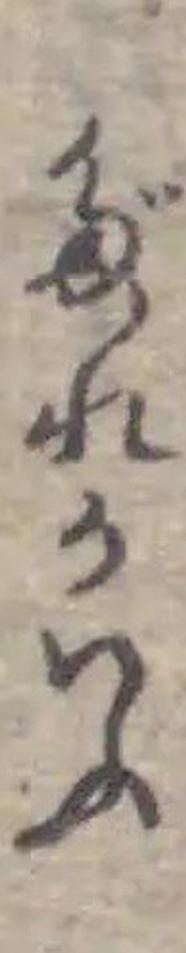たれかいふ
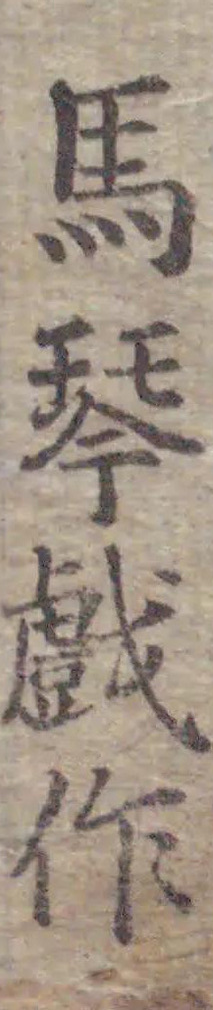馬琴戯作

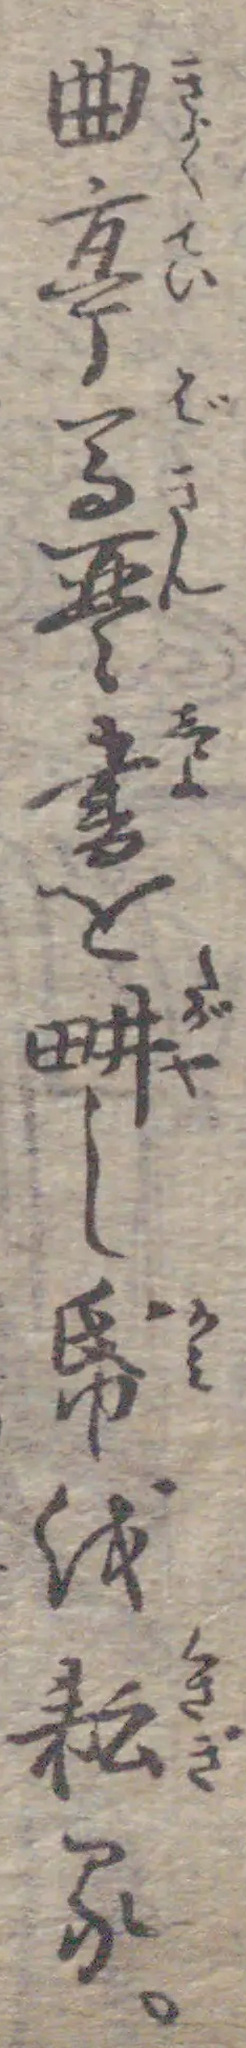曲亭馬琴書を耕し紙を耘る。
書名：福壽海旡量品玉 3巻
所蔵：国立国会図書館 National Diet Library, JAPAN
